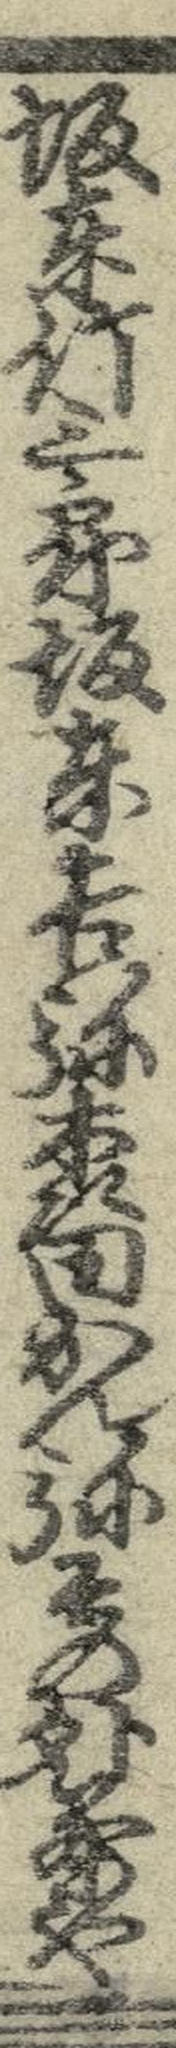坂東竹三郎坂東𠮷彌森田かん彌その外茶や
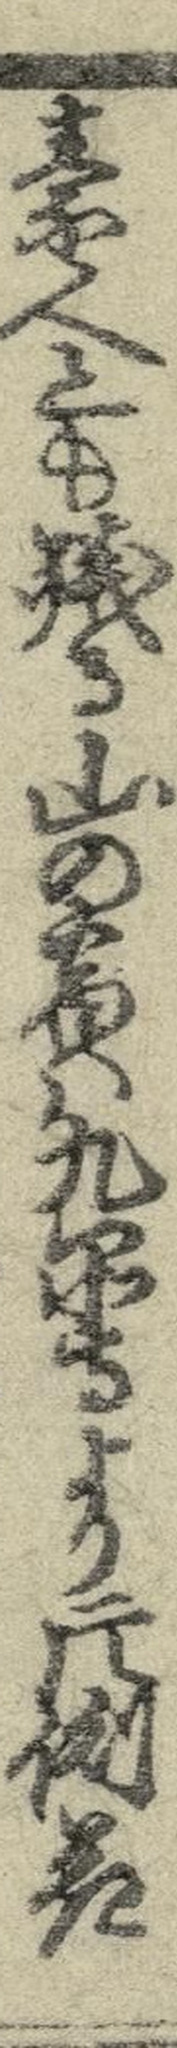素人とも殘る山の宿ハ九品寺より向側花
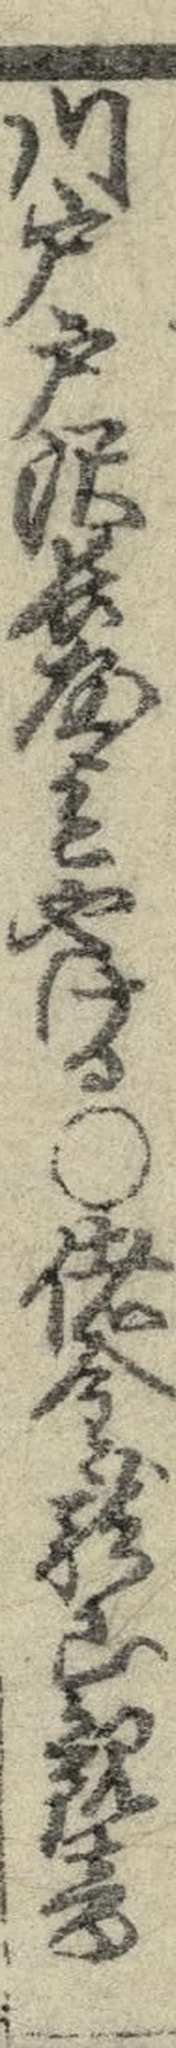川戸戸澤長屋迄やける〇偖金龍山觀音
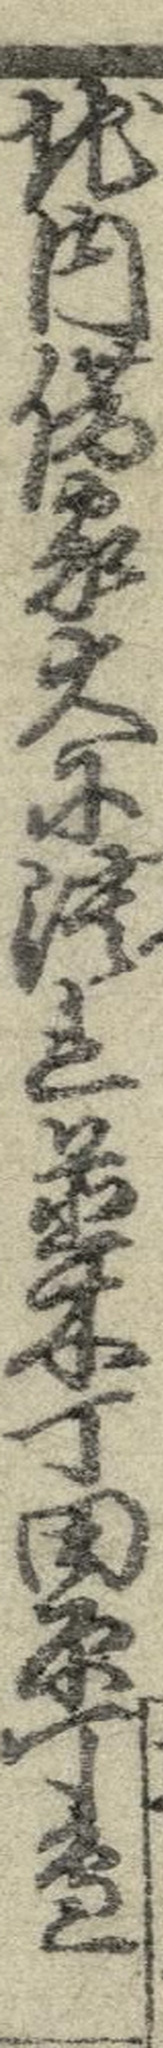地内借家大に潰れ並木丁田原丁邊
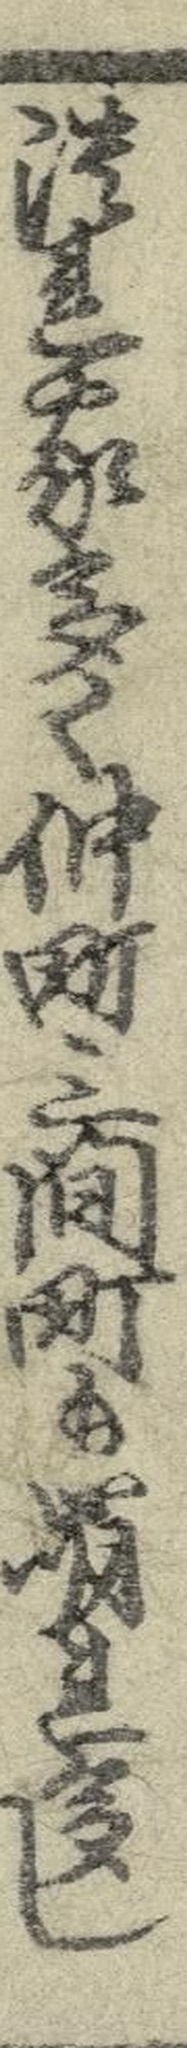潰れ家多く仲町三間町も崩れ多し
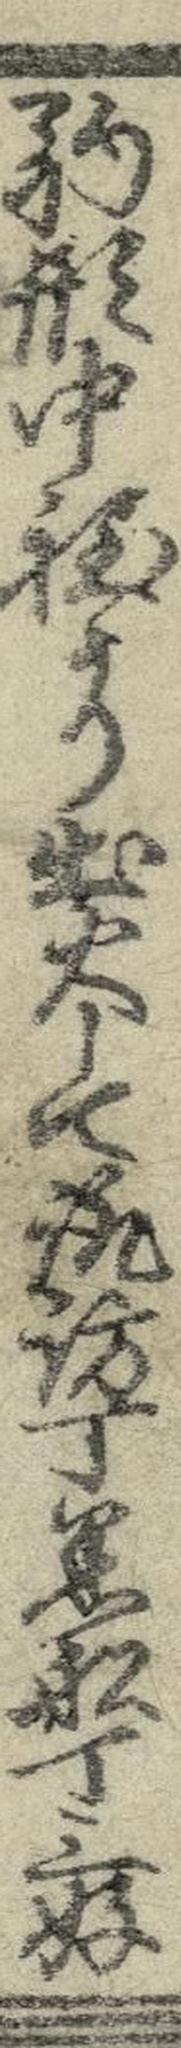駒形中程より出火して諏訪丁黑舩丁三好
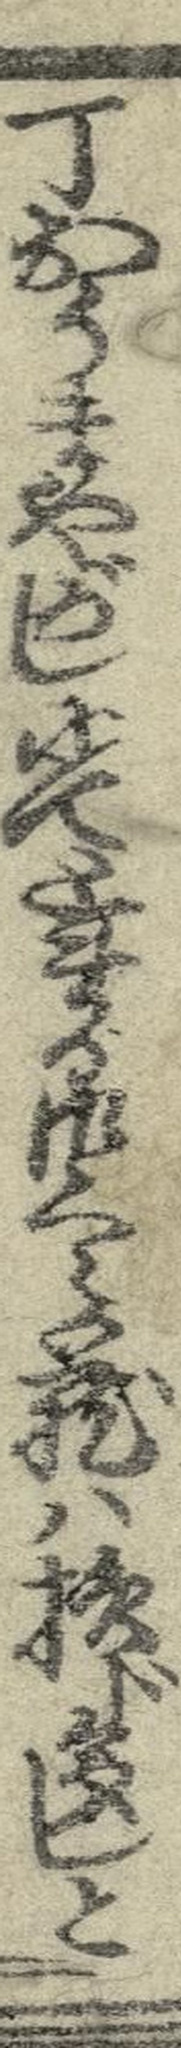丁おうまやがしにて止まる御へう藏ハ損じ多しと
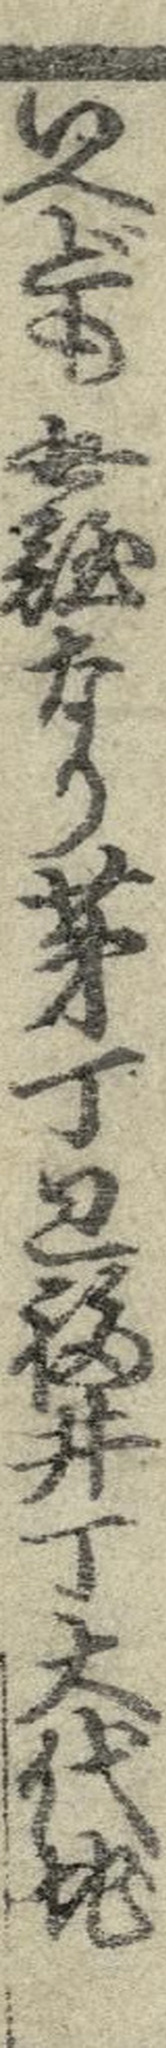いへども無難なり茅丁邊福井丁大代地
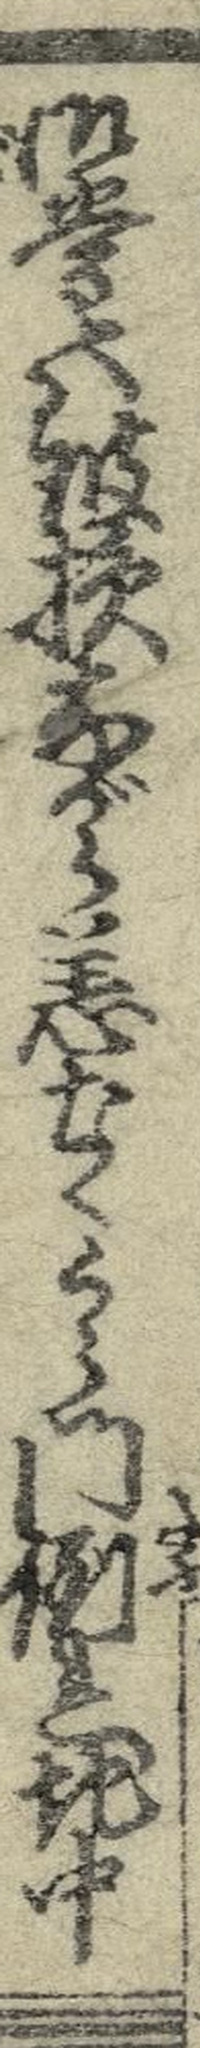御堂大破損ながら恙なくうら門倒れ地中
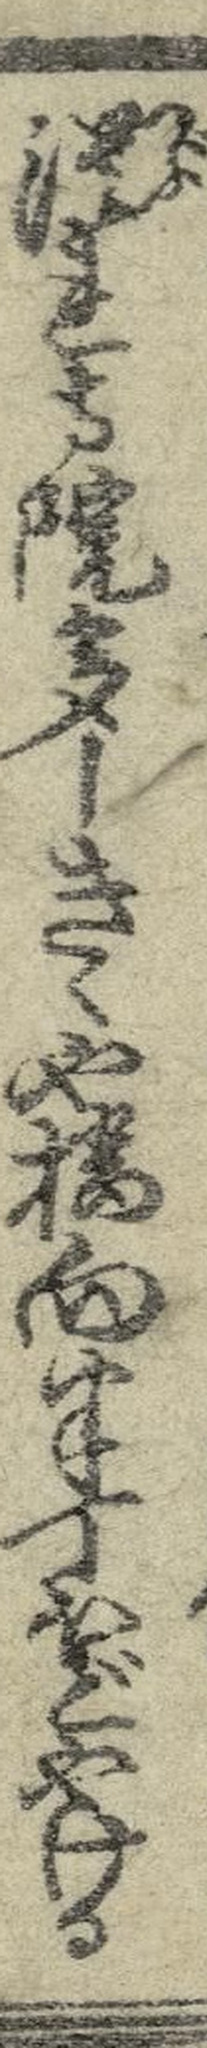潰れ寺院多しきくや橋向半丁ほどやける
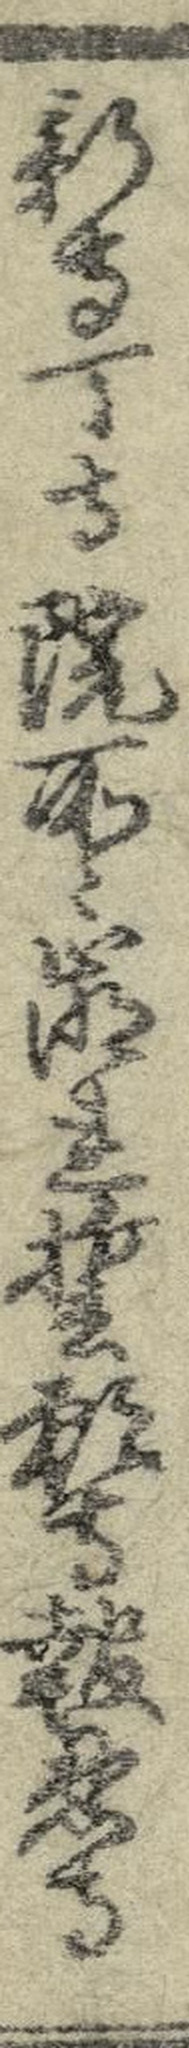新寺丁寺院所〻崩れ誓願寺報恩寺
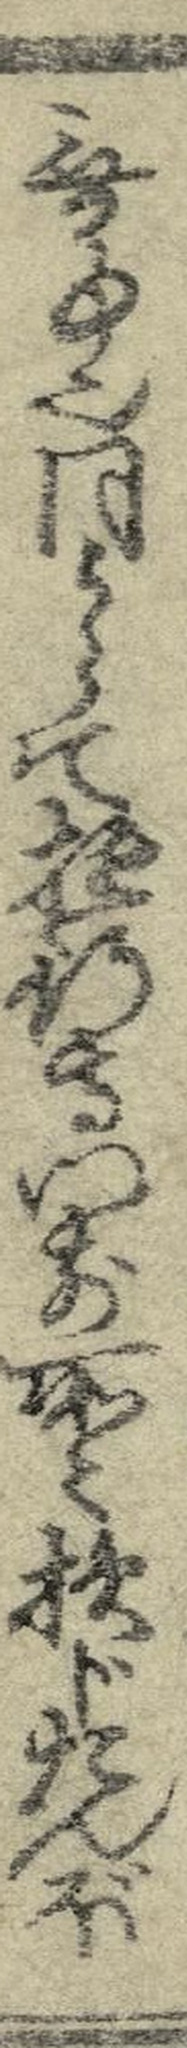無事也同うらて遊行寺門前所〻損じたんぼ
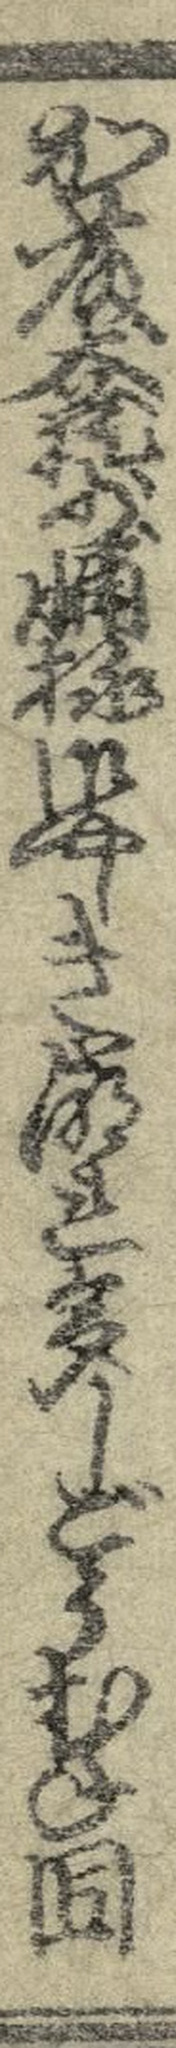加藤大藏少輔樣御やしき崩れ多しどうむね圍

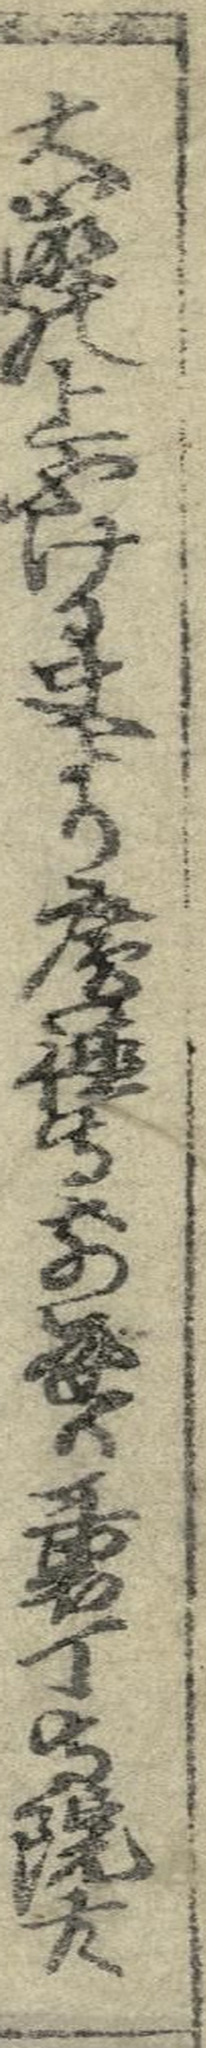大崩れの上やける夫より廣德寺前通り裏丁寺院は
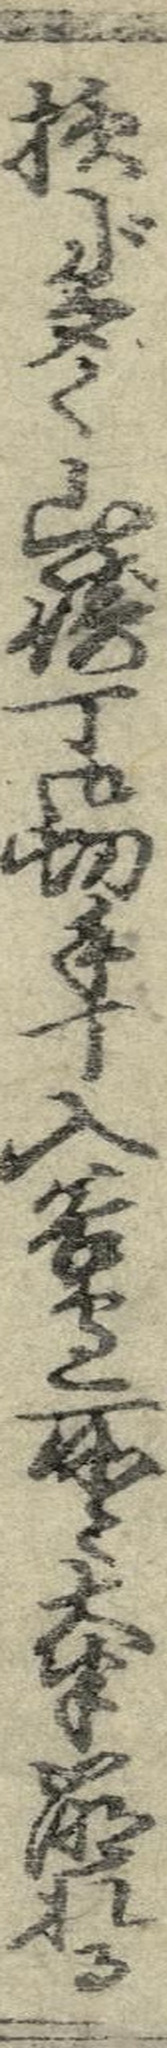損じ多く山崎丁御切手丁入谷邊所〻大半崩れる
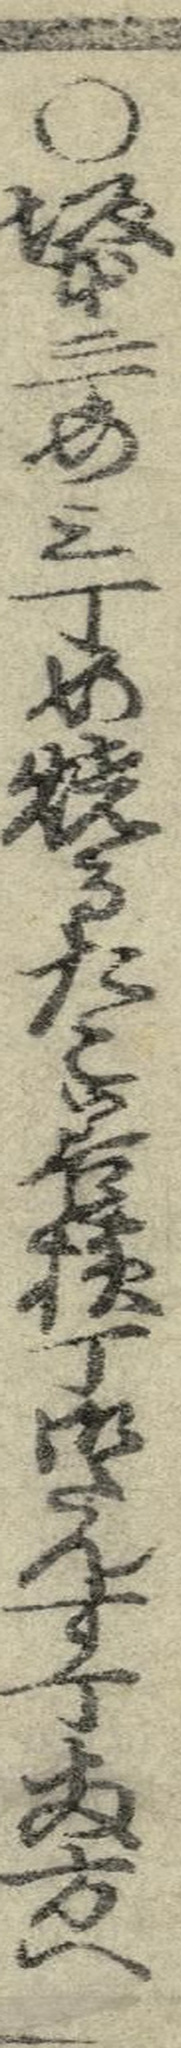〇坂本二丁め三丁め燒るたこ谷橫丁御たんす丁兩方へ
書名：地震並出火細見記
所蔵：東京大学地震研究所図書室 Earthquake Research Institute Library, The University of Tokyo, JAPAN
